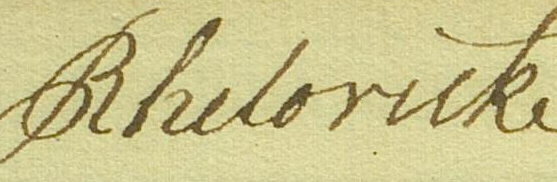Rhetorick
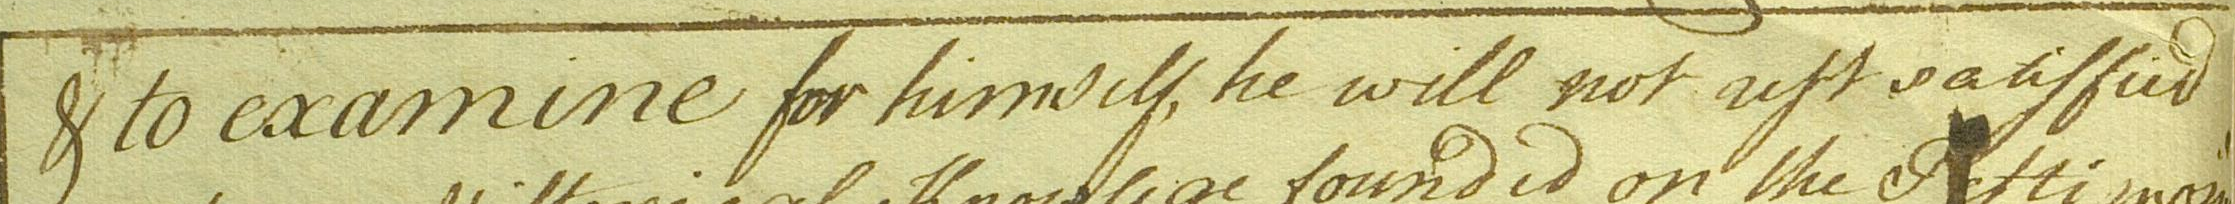& to examine for himself, he will not rest satisifed
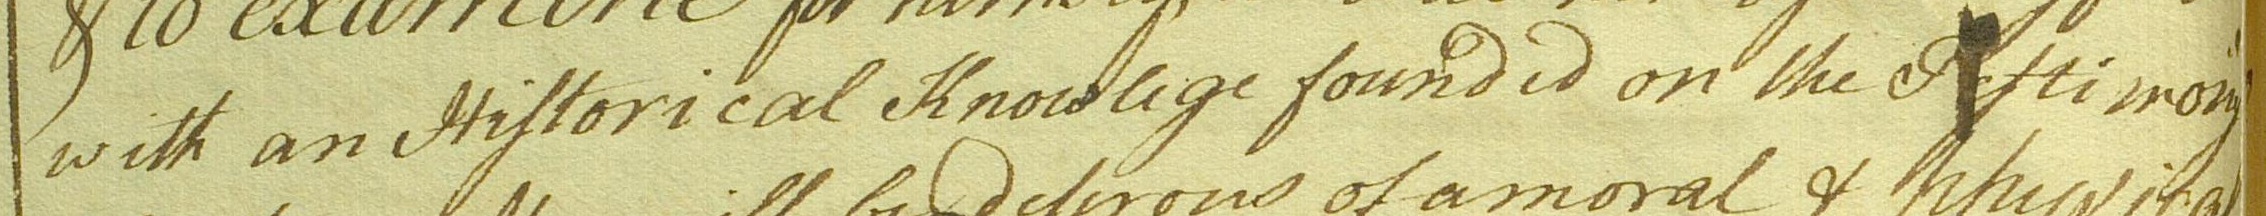with an Historical Knowledge founded on the Testimony
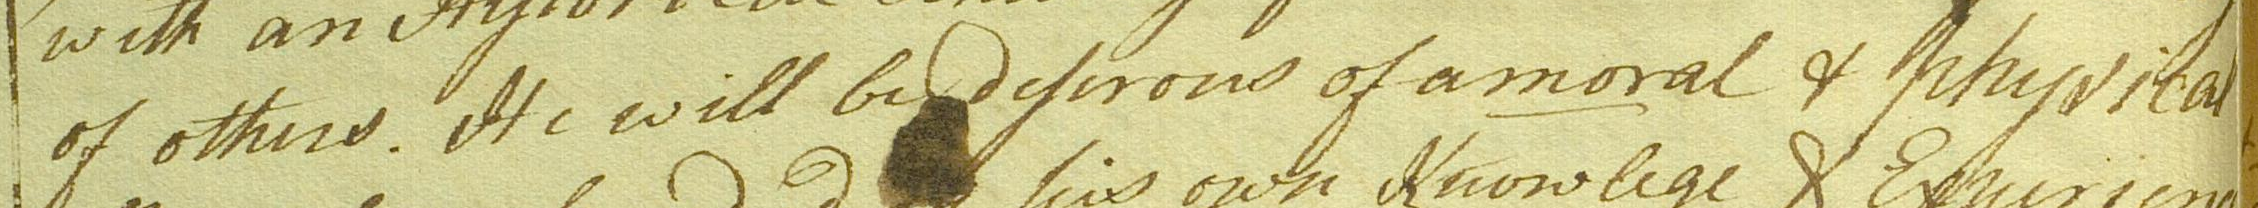of others. He will be desirous of a moral & physical
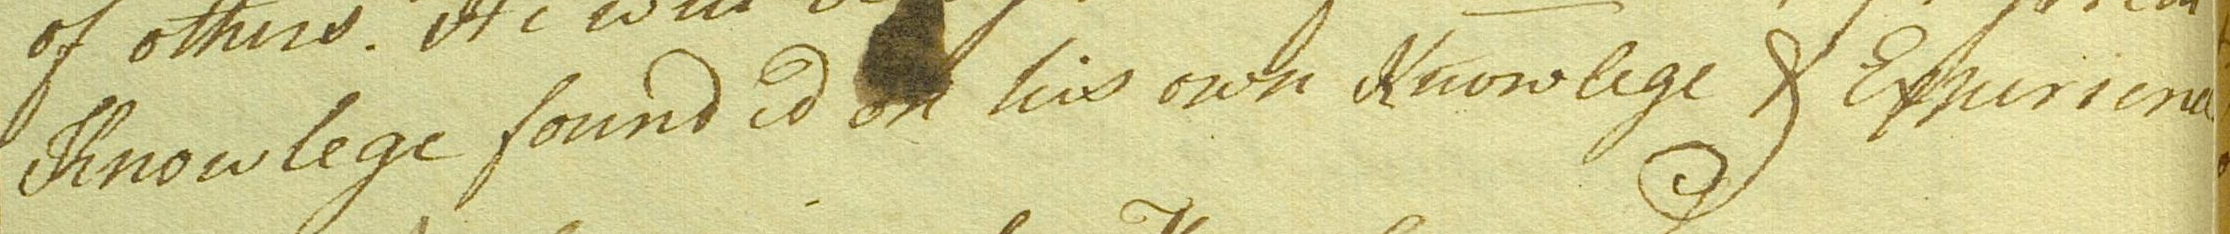Knowledge founded on his own Knowledge & Experience.
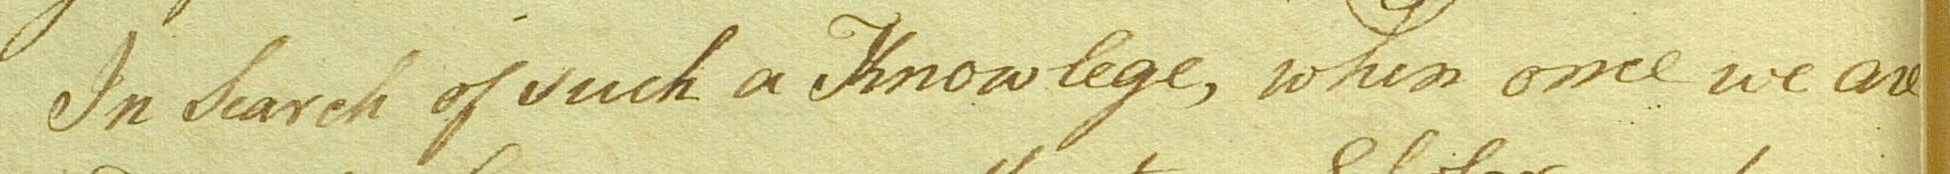In Search of such a Knowledge, when once we are
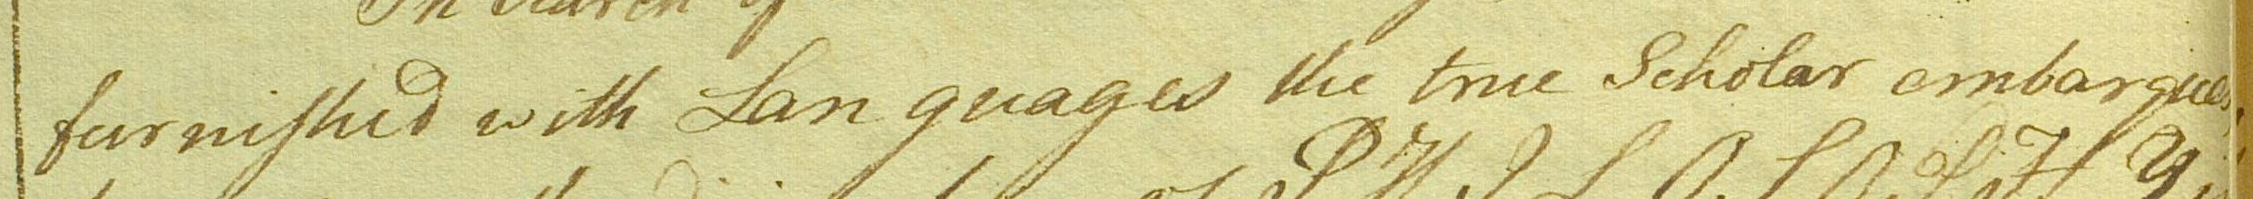furnished with Languages the true Scholar embarques
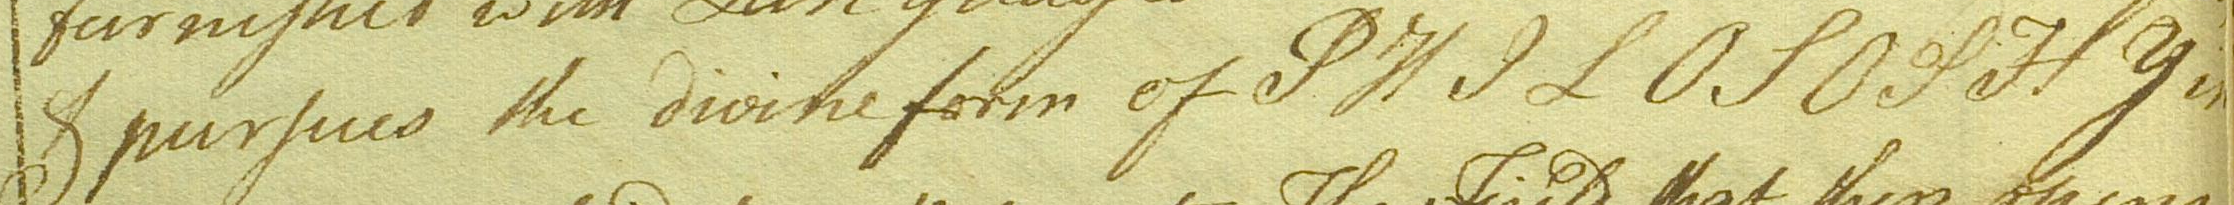& pursues the divine form of PHILOSOPHY in
